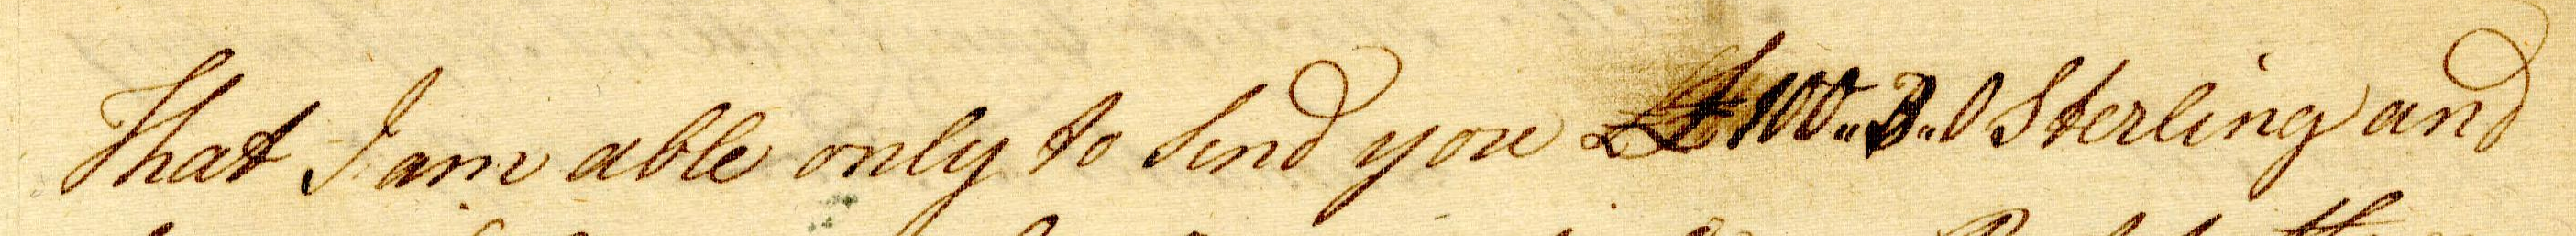That I am able only to send you £100..3..0 Sterling and
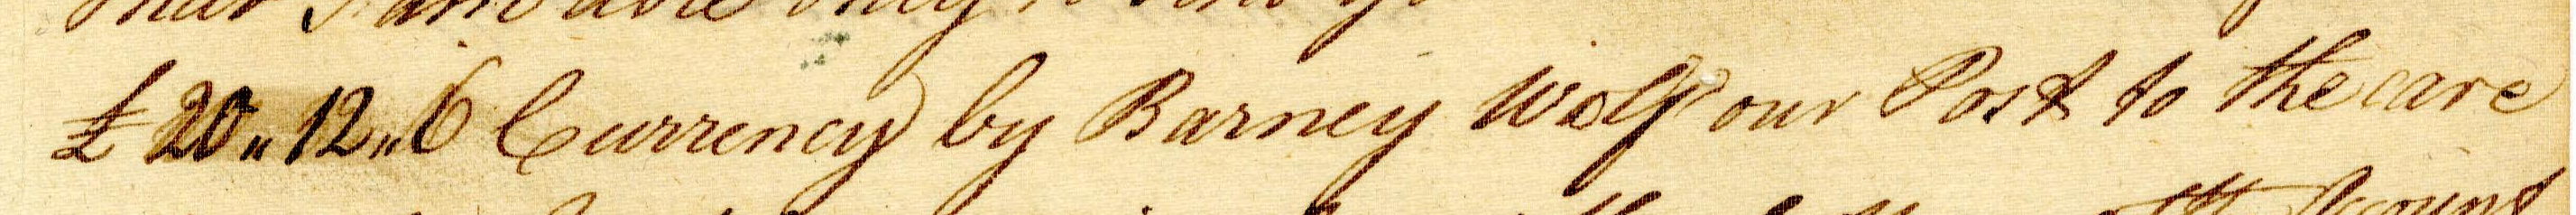£20..12..6 Currency by Barney Wolf our Post to the care
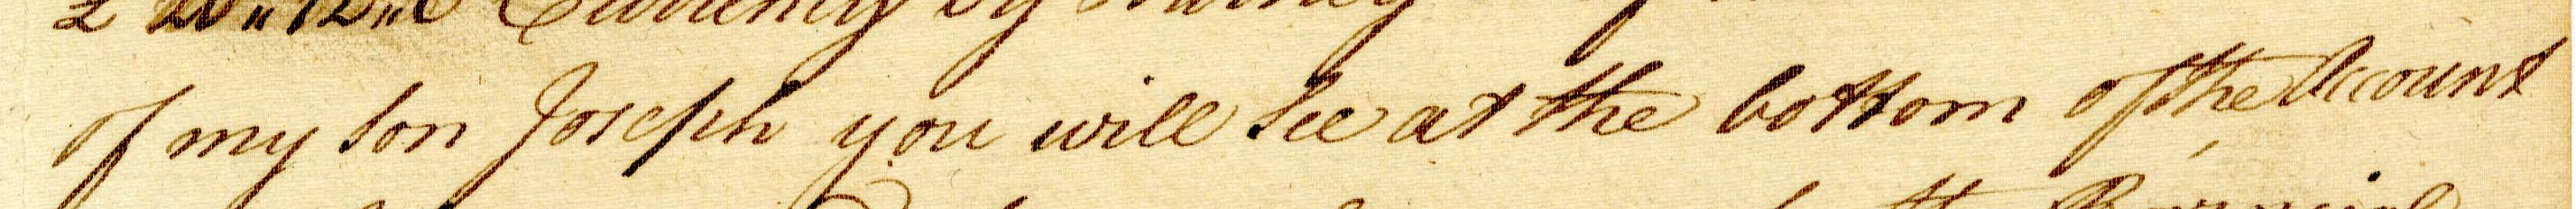of my Son Joseph you will see at the bottom of the Account
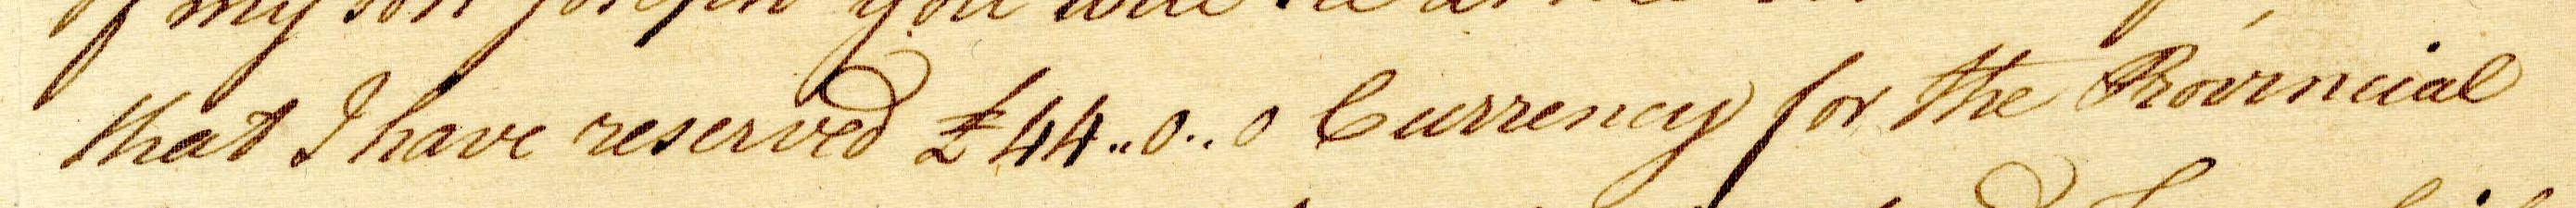that I have reserved £44..0..0 Currency for the Provincial
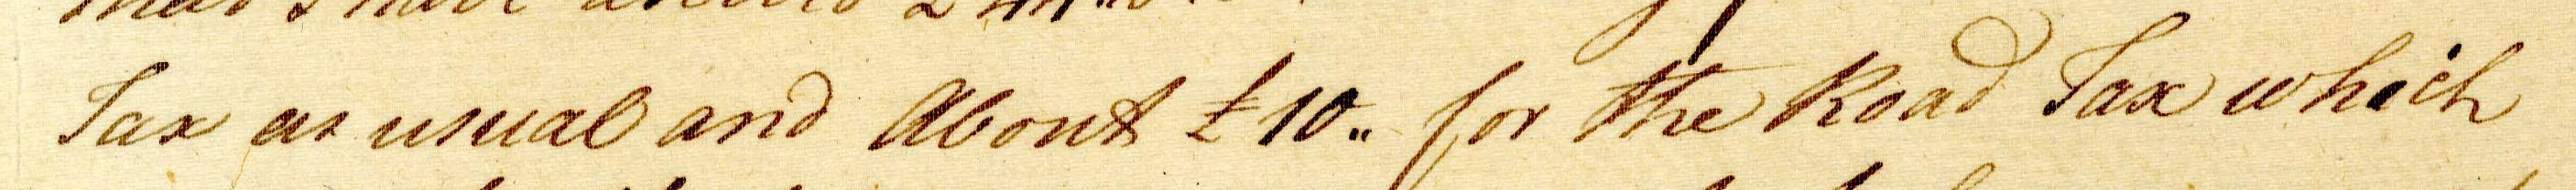Tax as usual and About £10.. for the Road Tax which
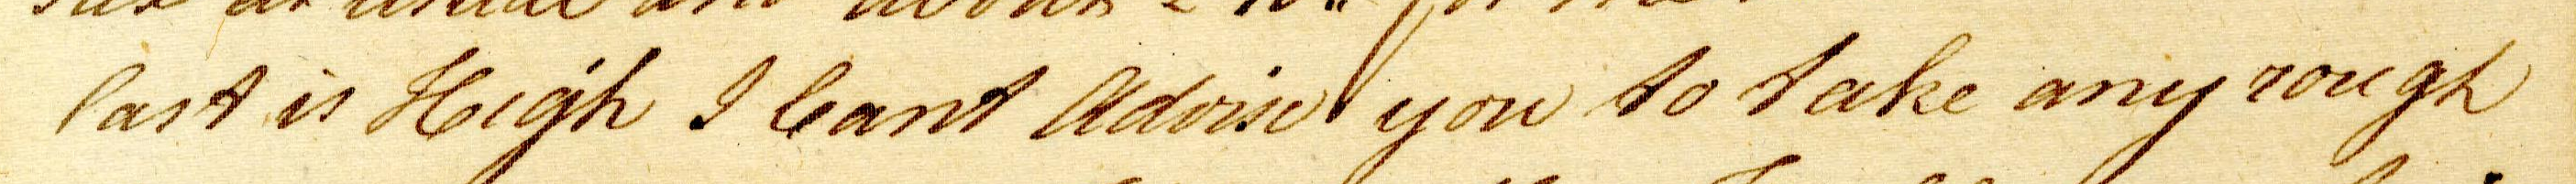Part is High I Cant Advise you to take any rough
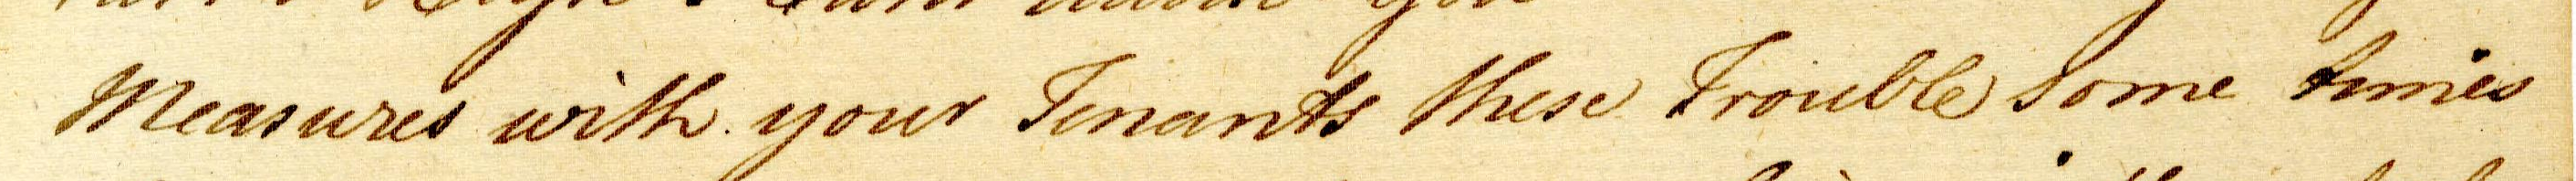Measures with your Tenants these Trouble some times
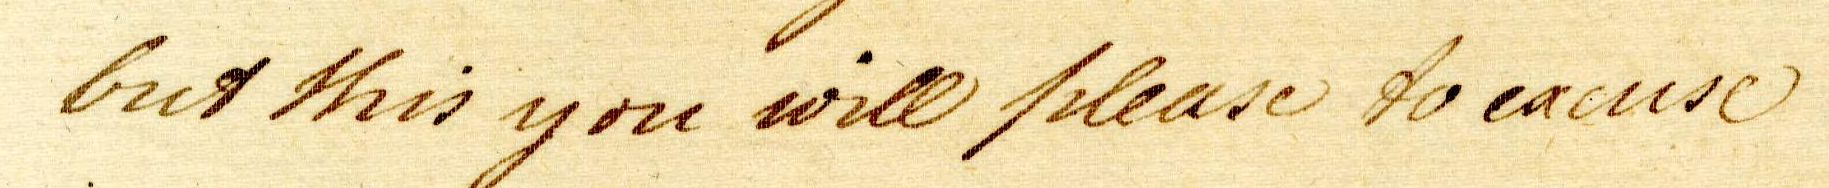but this you will please to excuse
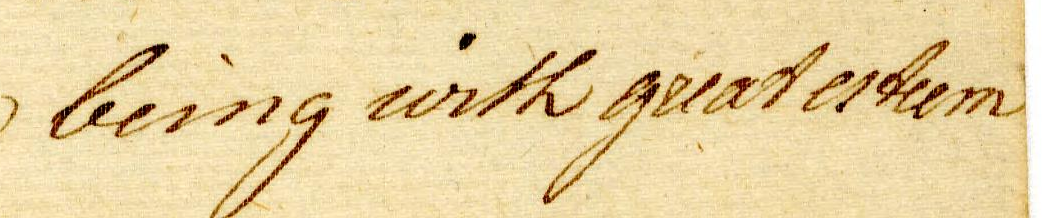being with great esteem
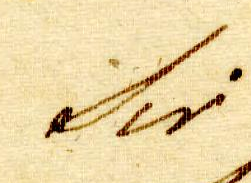Sir
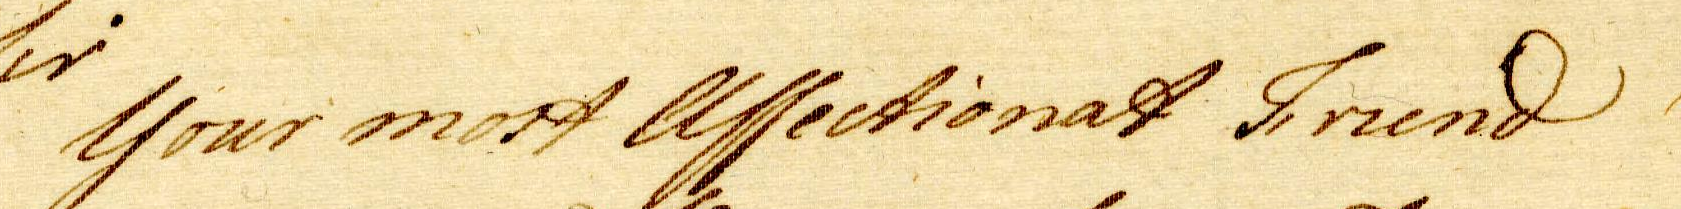Your most Affectionat Friend
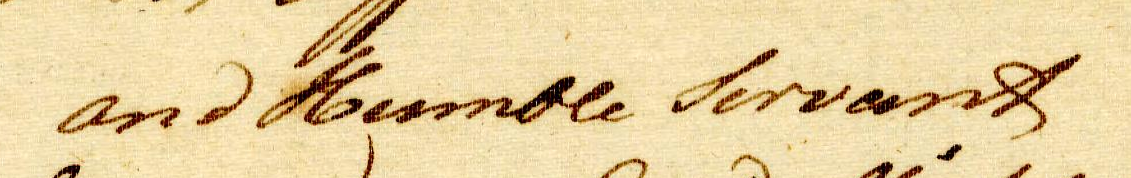and Humble Servant
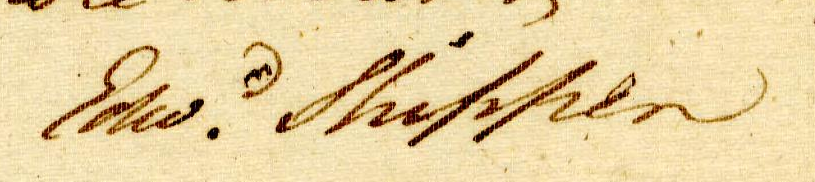Edw.^d Shippen
